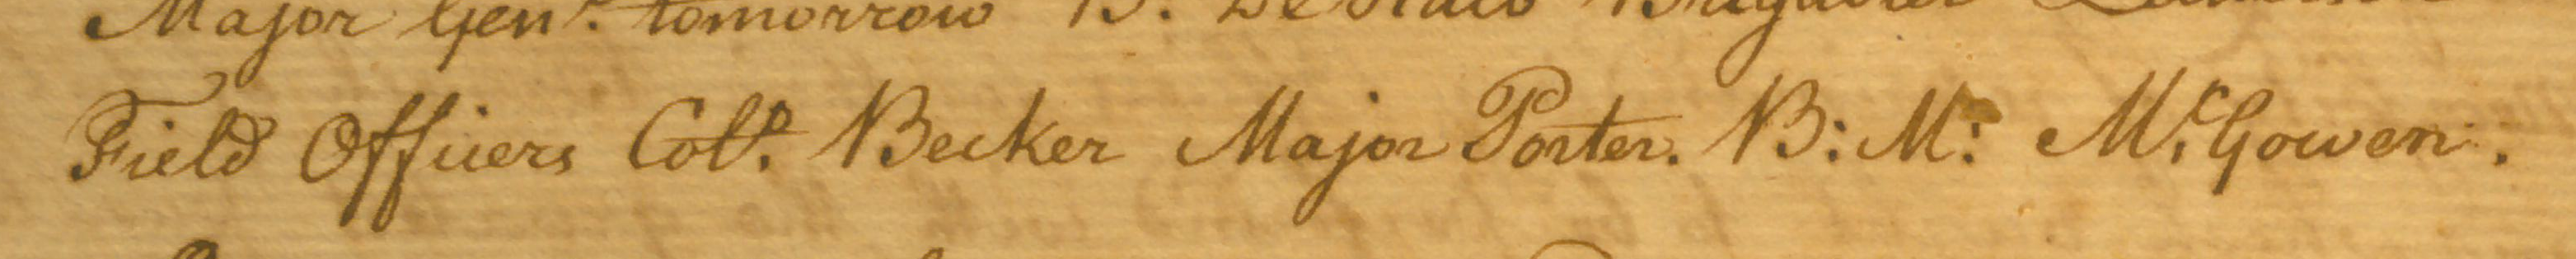Field Officers Col^o. Becker Major Porter. B: M: M^c.Gowen.
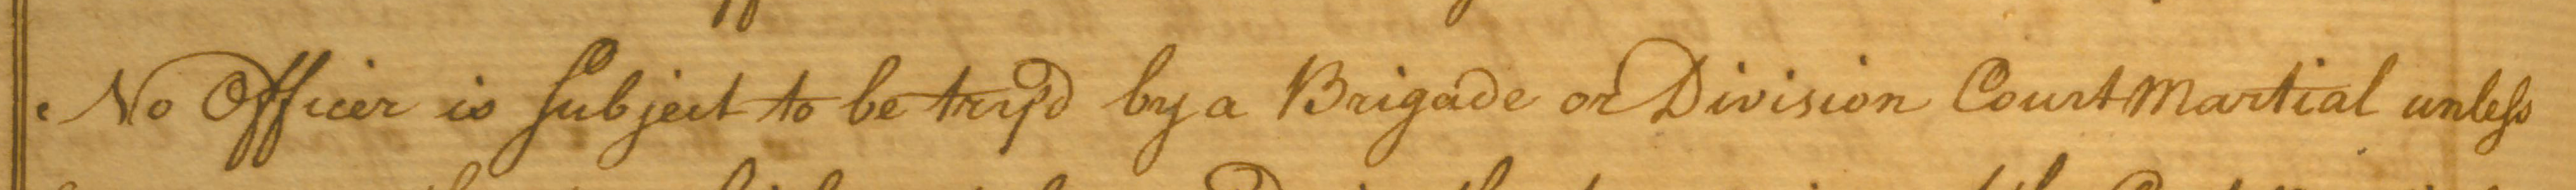No Officer is subject to be try'd by a Brigade or Division Court Martial unless
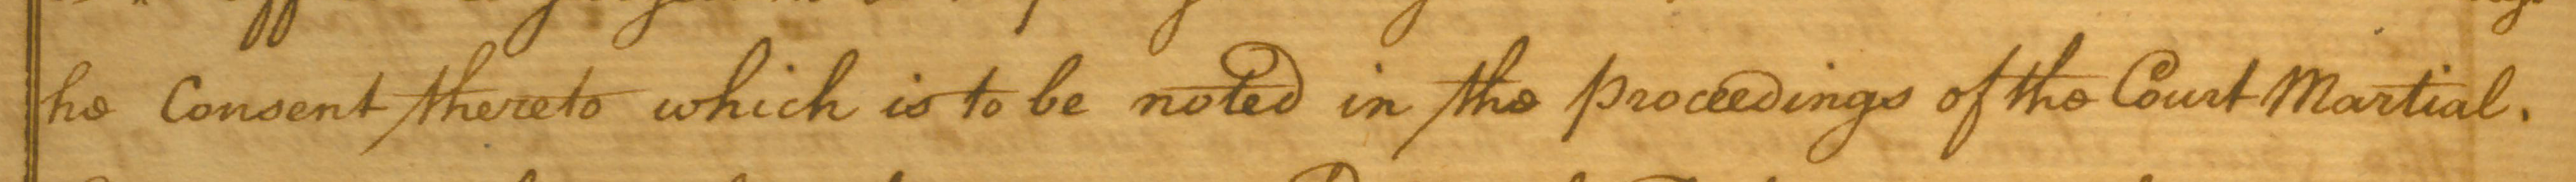he Consent thereto which is to be noted in the proceedings of the Court Martial.
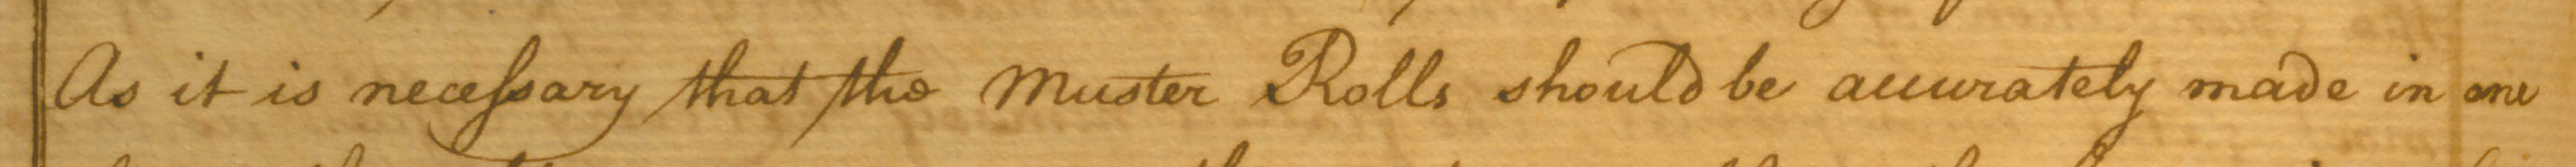As it is necessary that the muster Rolls should be accurately made in one
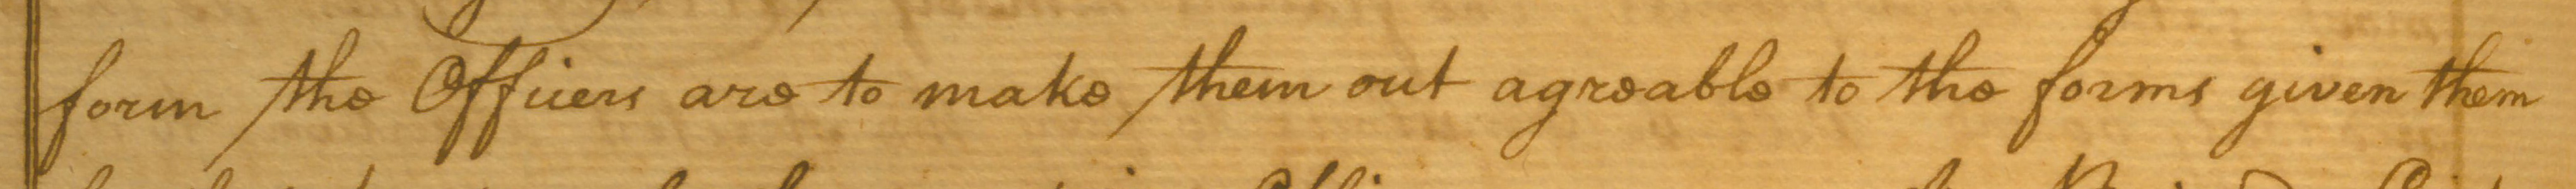form the Officers are to make them out agreable to the forms given them
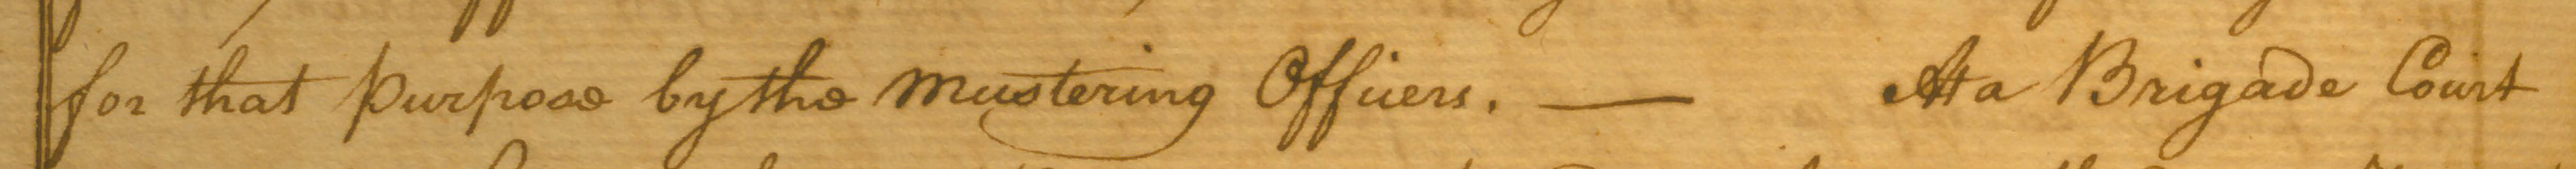for that purpose by the mustering Officers.- As a Brigade Court
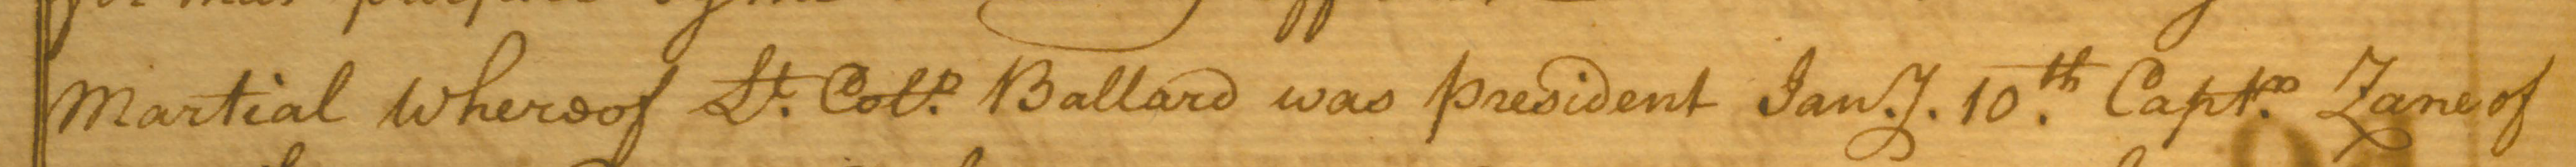Martial whereof L^t. Col^o. Ballard was president Jan^y. 10^th. Capt^n. Zane of
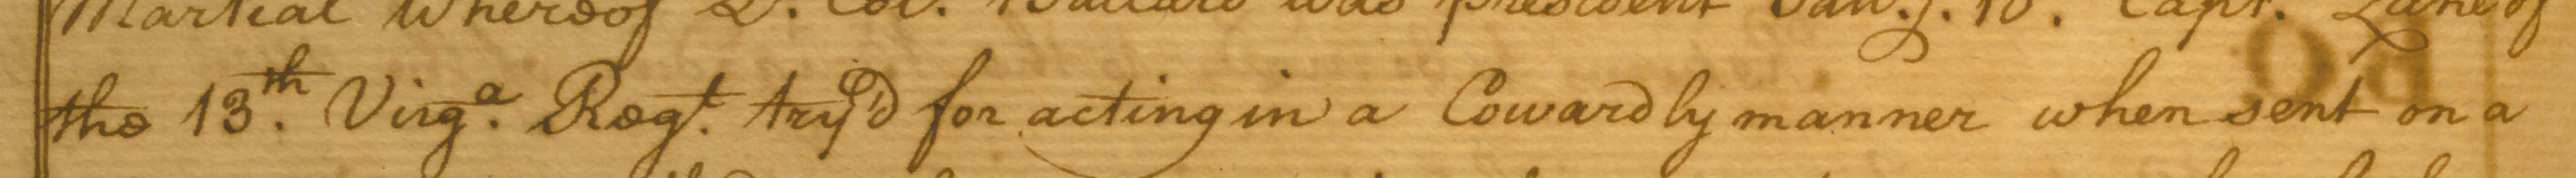the 13^th. Virg^a. Reg^t. try'd for acting in a Cowardly manner when sent on a
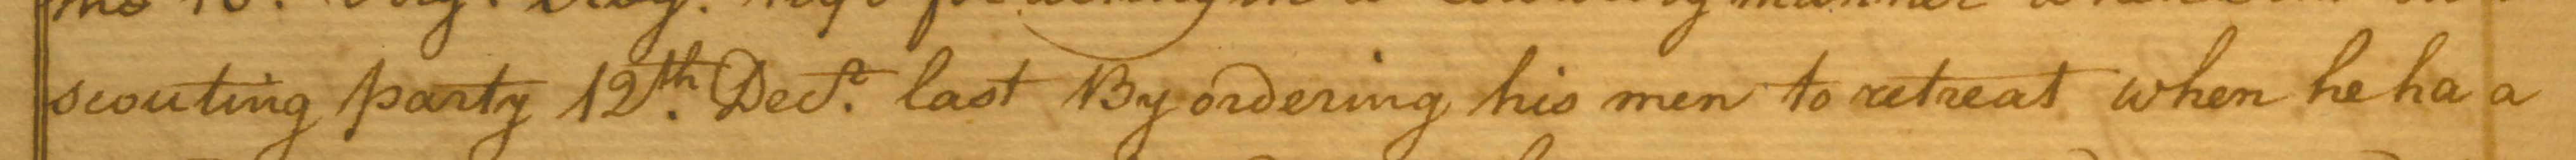scouting party 12^th. Dec^r. last By ordering his men to retreat when he ha a
